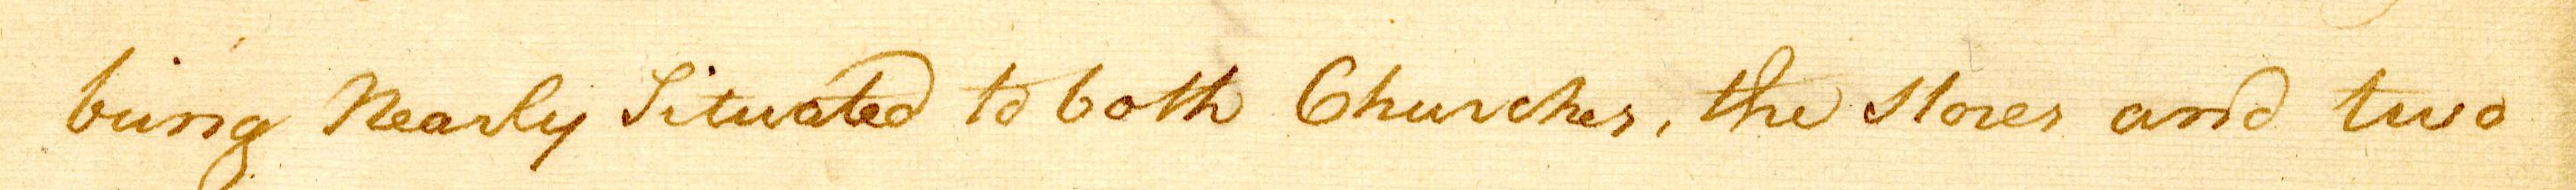being Nearly Situated to both Churches, the stores and two
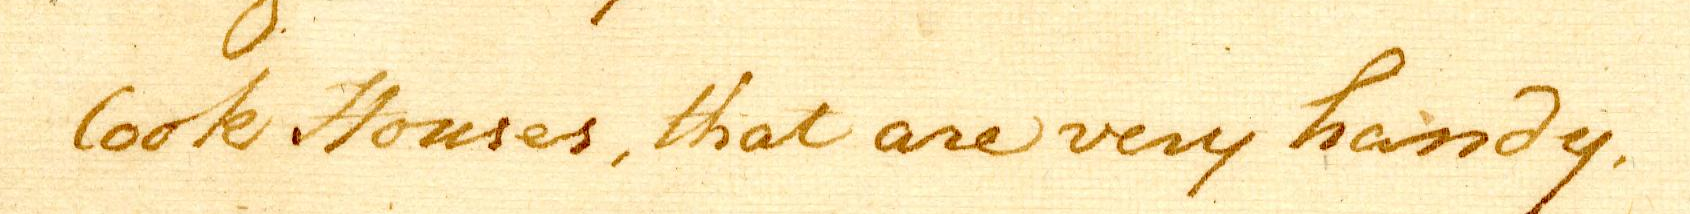Cook Houses, that are very handy.
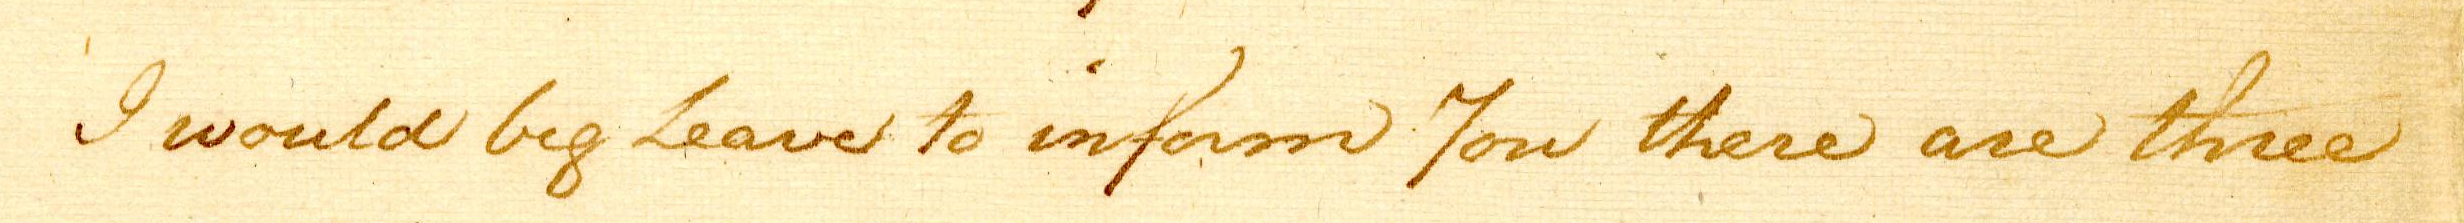I would beg leave to inform You there are three
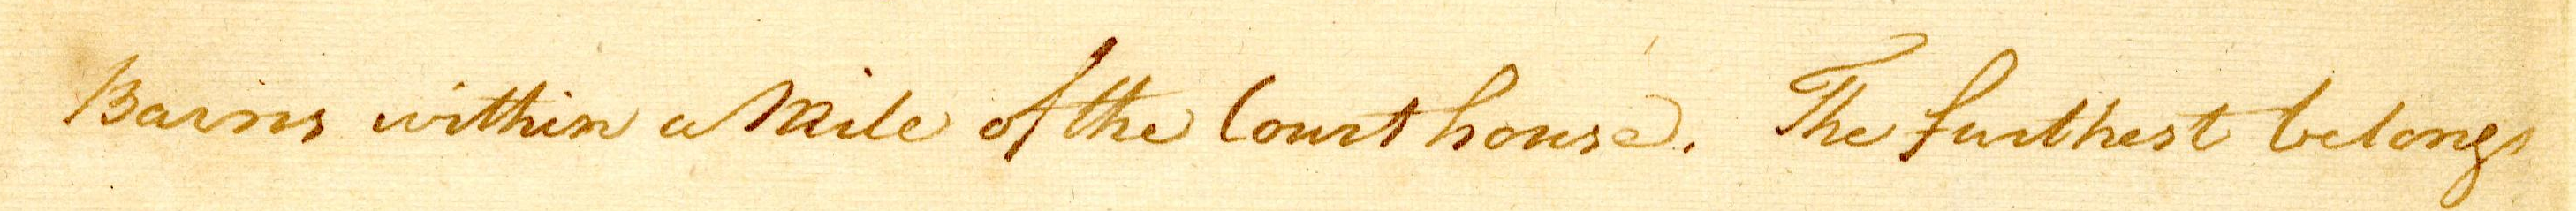Barns within a Mile of the Courthouse. The furthest belong
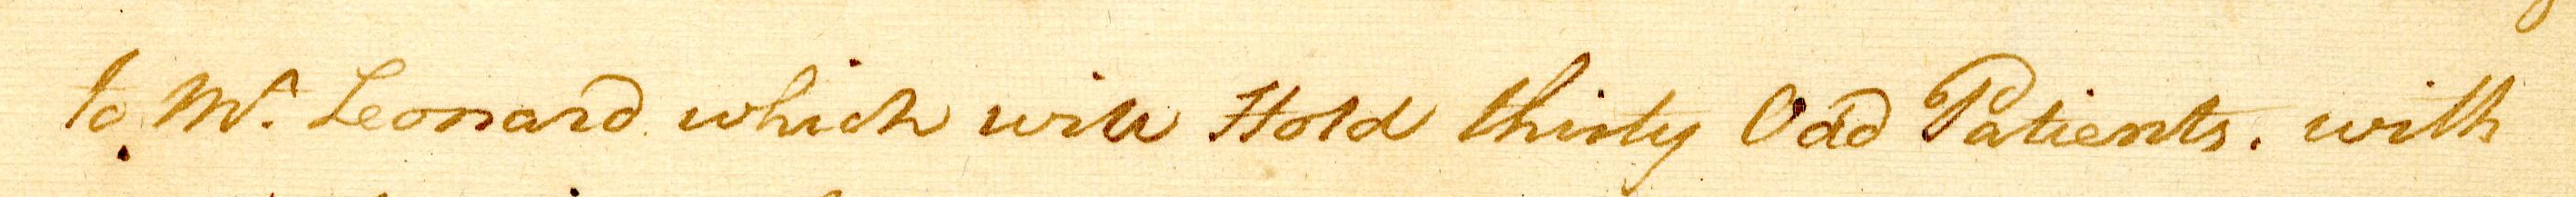to M^r. Leonard which will Hold thirty Odd Patients. with
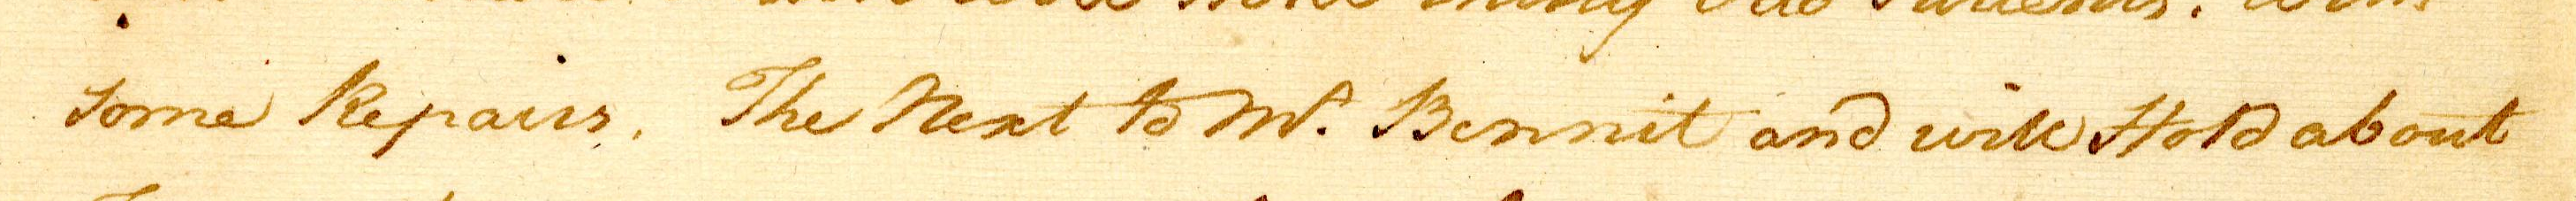some Repairs. The Next to M^r. Bennit and will Hold about
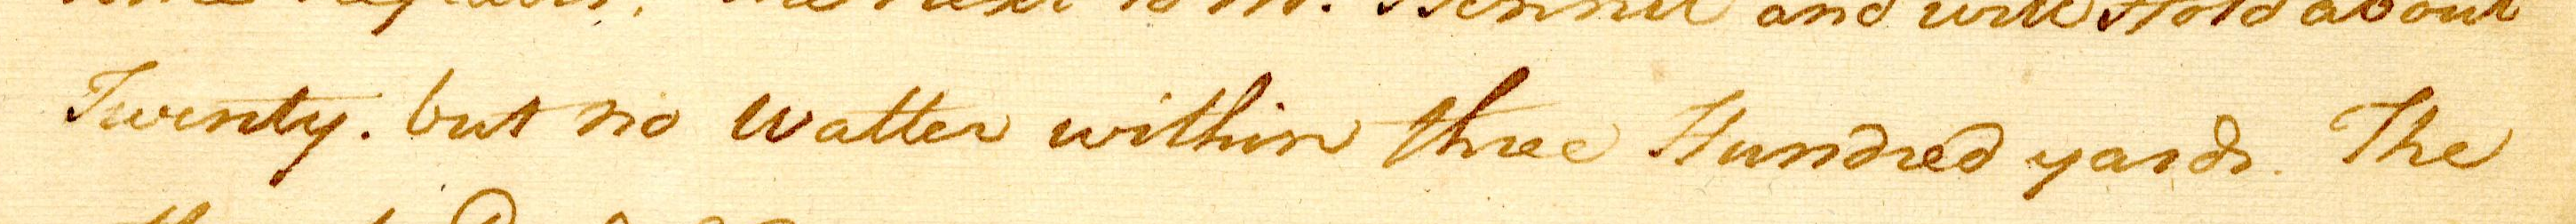Twenty. but no watter within three Hundred yards. The
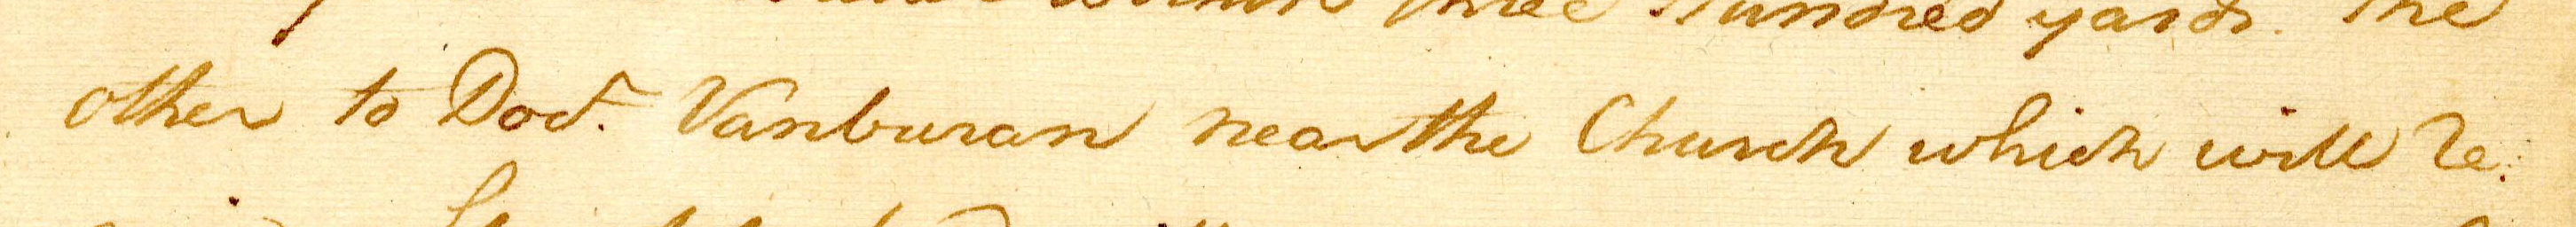other to Doc^r. Vanburan near the Churchwhich will re-
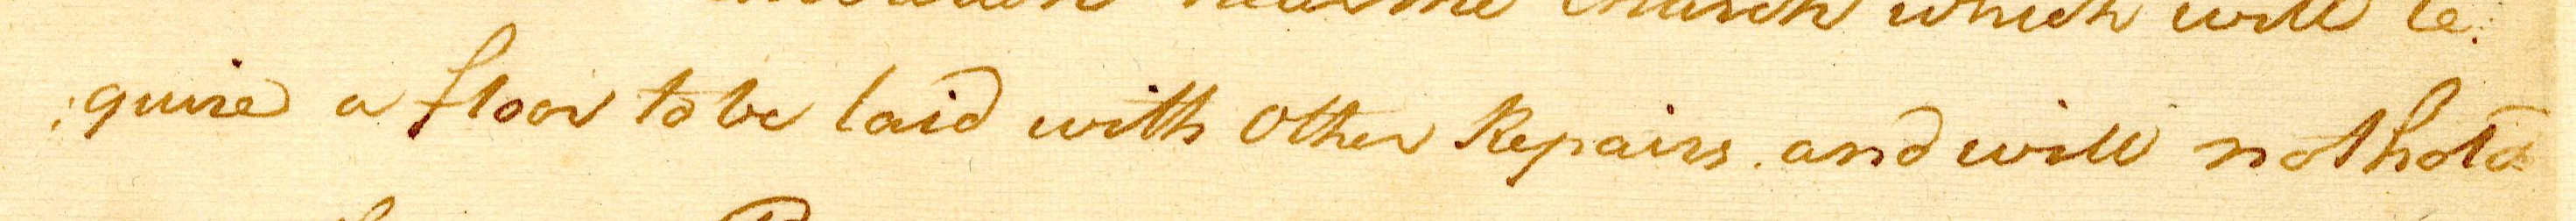-quire a floor to be laid with other Repairs and will not hold
